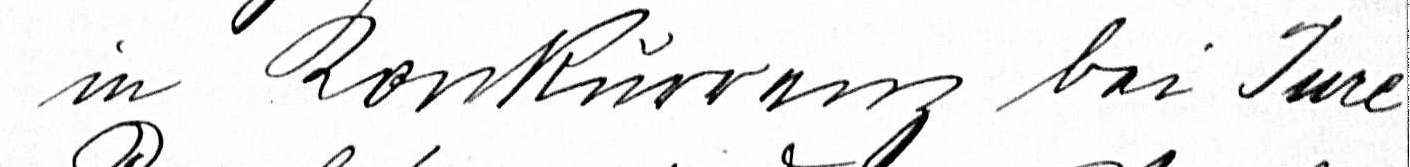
in Konkurrenz bei Jure
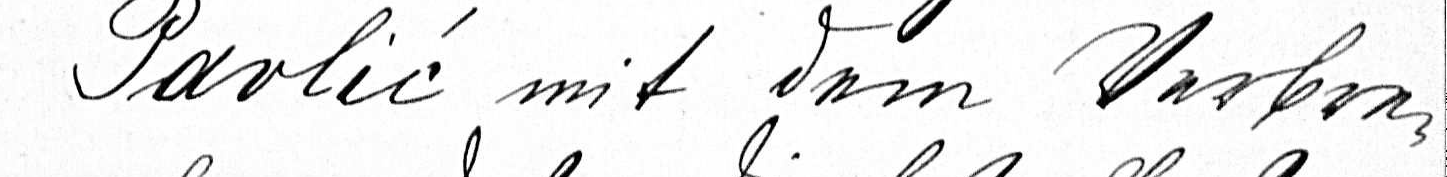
Pavlić mit dem Verbre¬
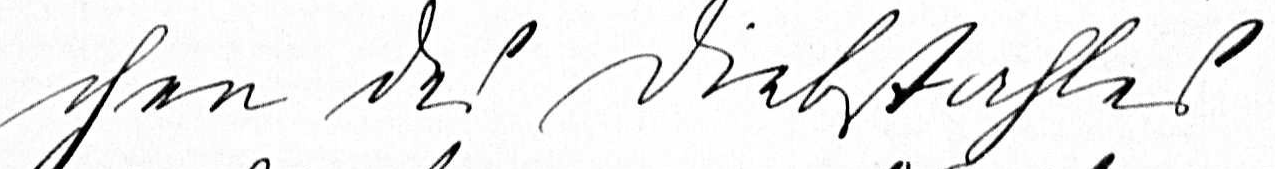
chen des Diebstahles
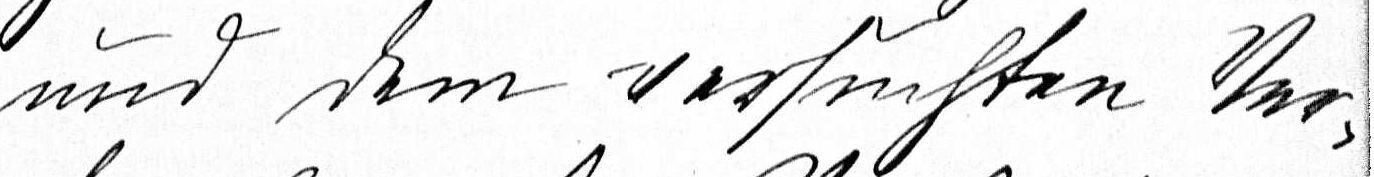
und dem versuchten Ver¬
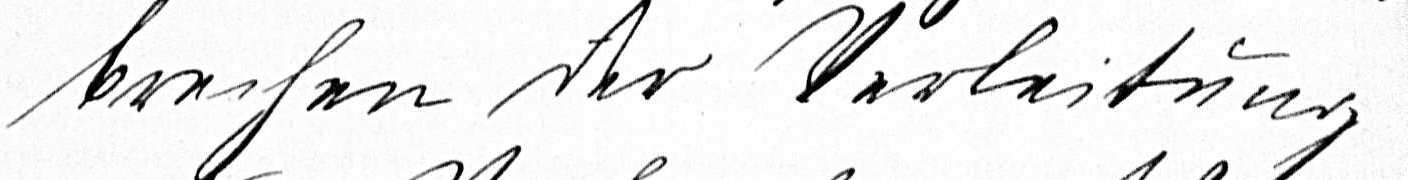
brechen der Verleitung
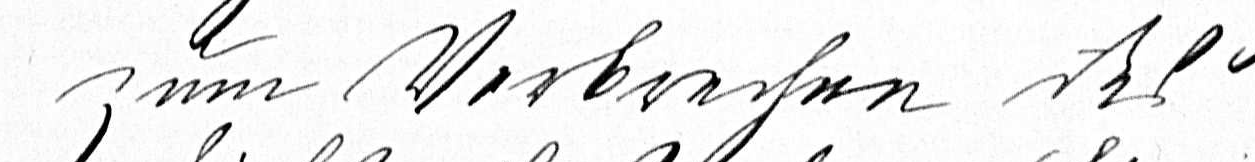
zum Verbrechen des
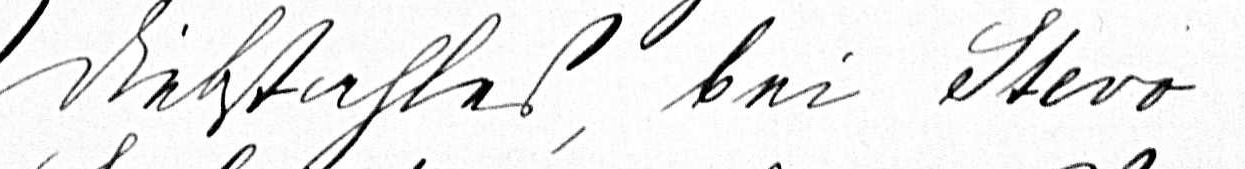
Diebstahles, bei Stevo
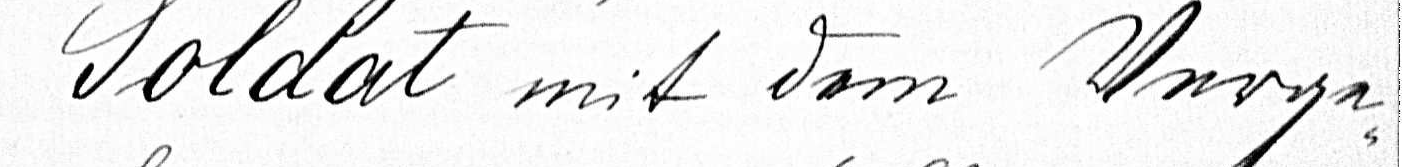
Soldat mit dem Verge¬
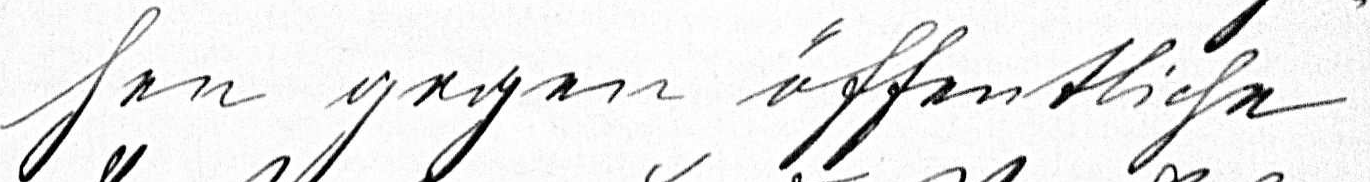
hen gegen öffentliche
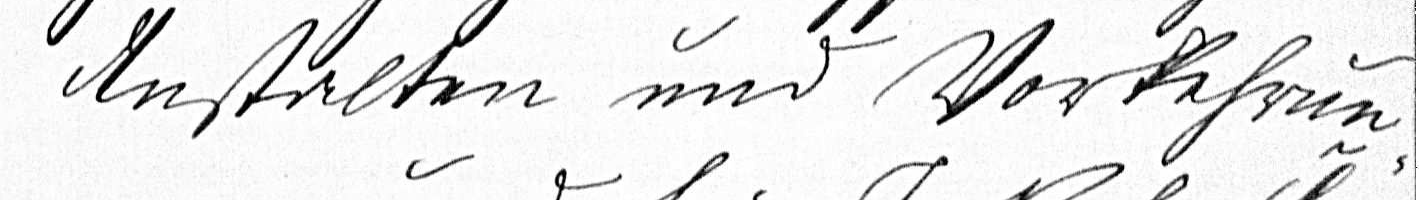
Anstalten und Vorkehrun
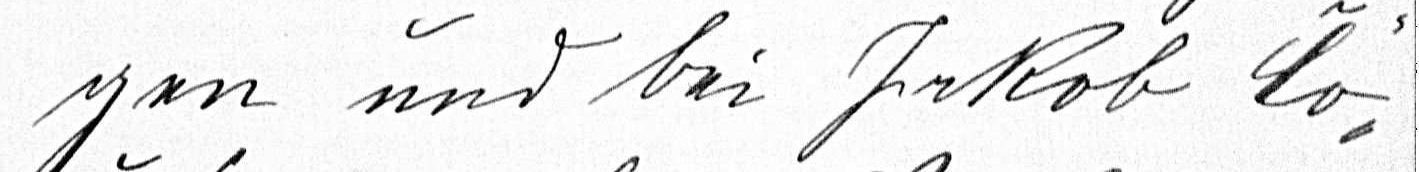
gen und bei Jakob Čo¬
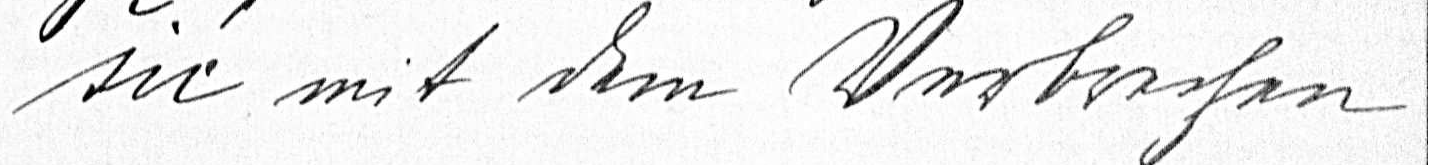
šić mit dem Verbrechen
